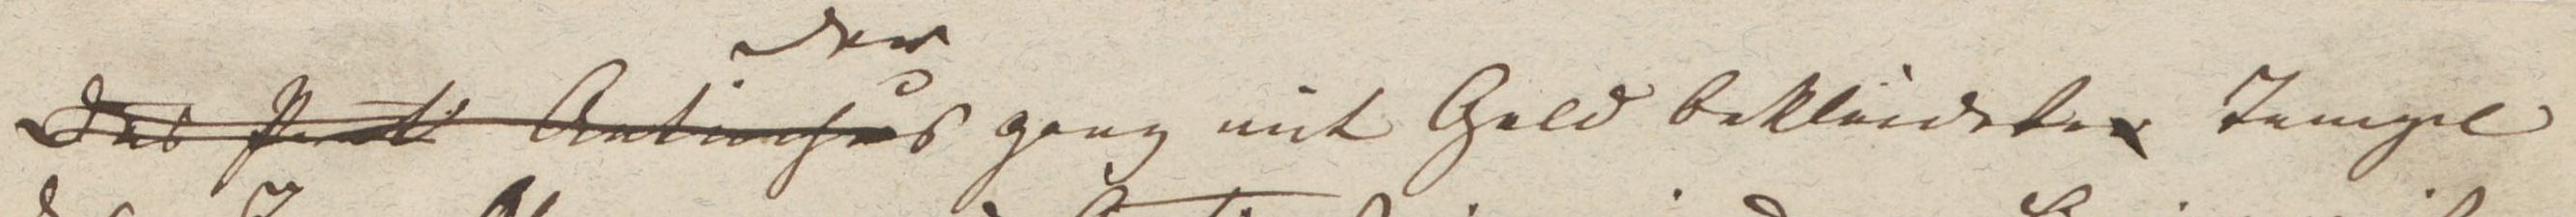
Das P Antios Der ganz mit Gold bekleidete Tempel
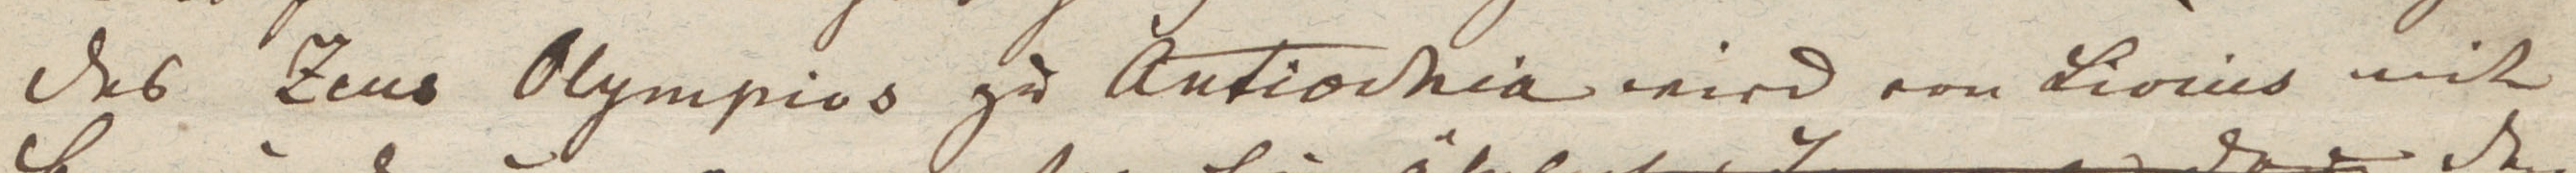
des Zeus Olympios zu Antiochia wird von Livius mit
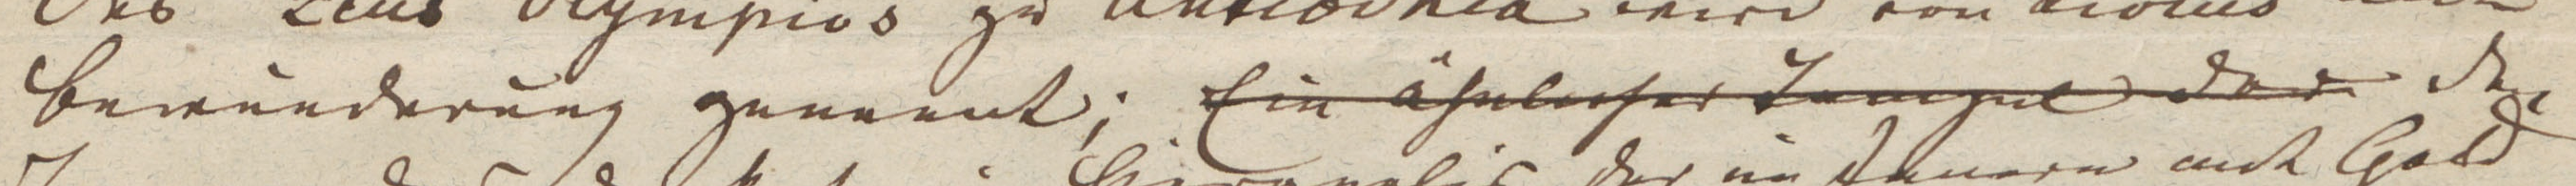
Bewunderung genannt; Ein ähnlicher Tempel der Den
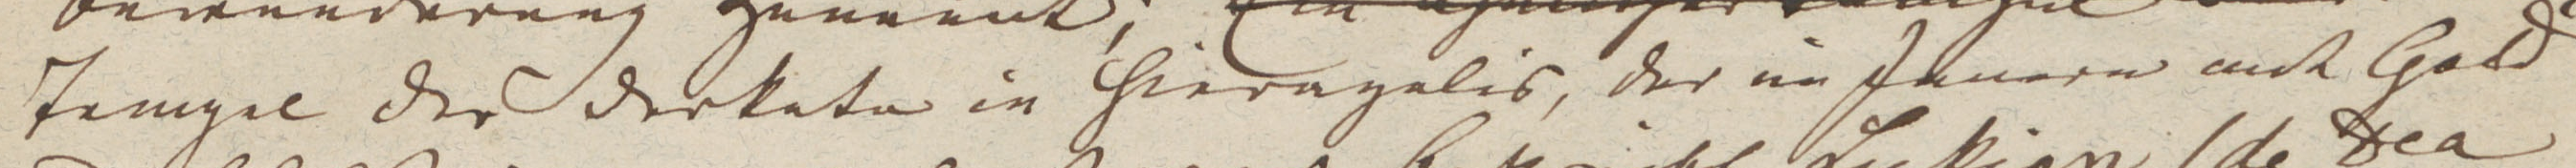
Tempel der Derkta in Hierapolis, der im Innern mit Gold
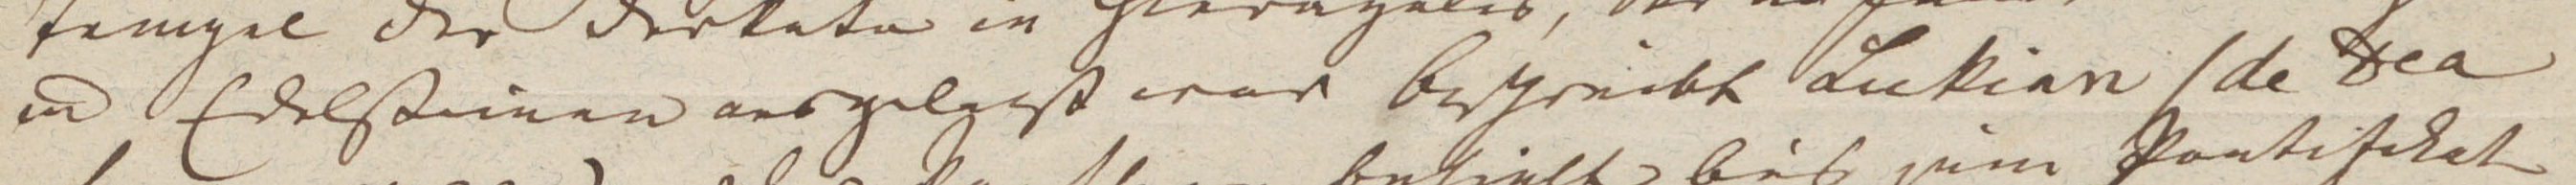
und Edelsteinen ausgelegt war beschreibt Lukian (de Dea
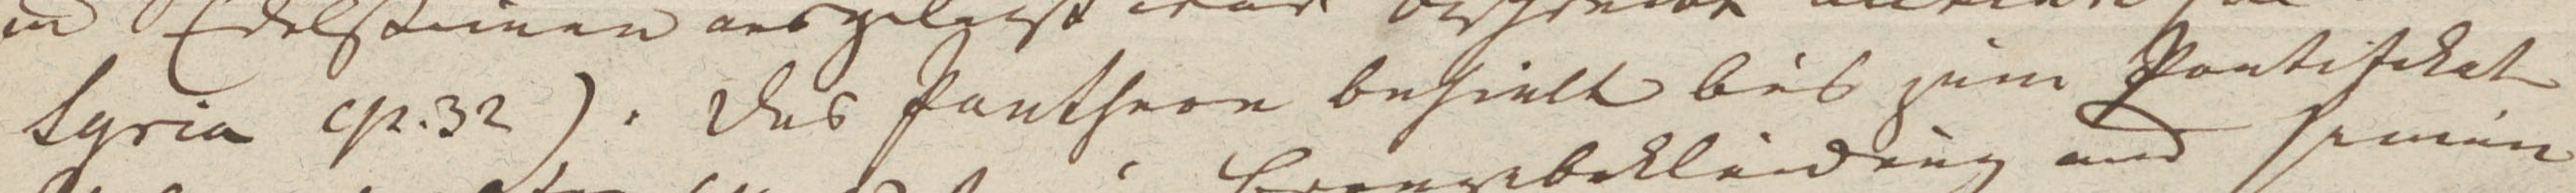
Syria cp. 32). Das Pantheon behielt bis zum Pontifikat
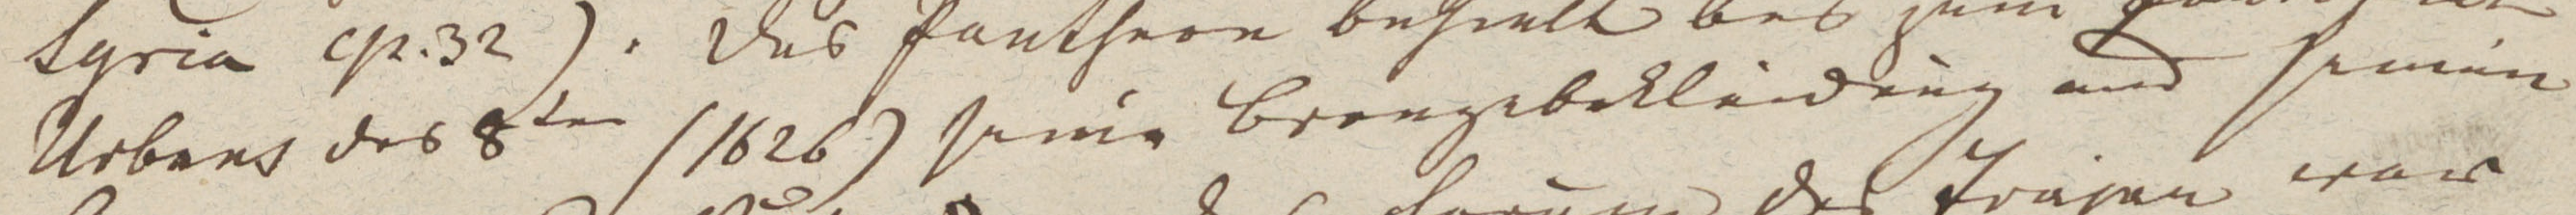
Urbans des 8ten (1626) seine Bronzebekleidung und seinen
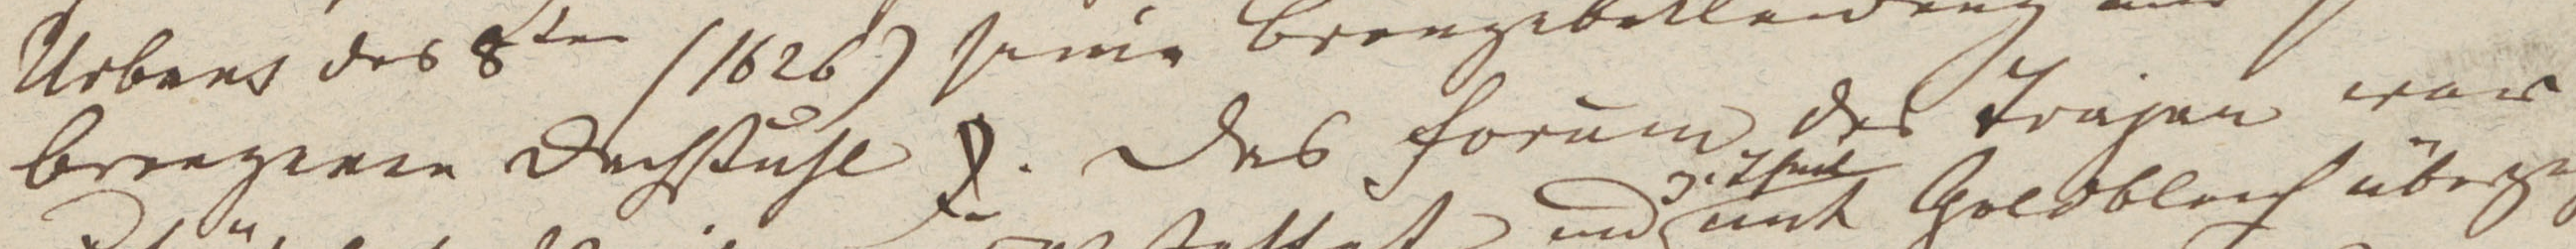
bronzenen Dachstuhl). Das Forum des Trajan war
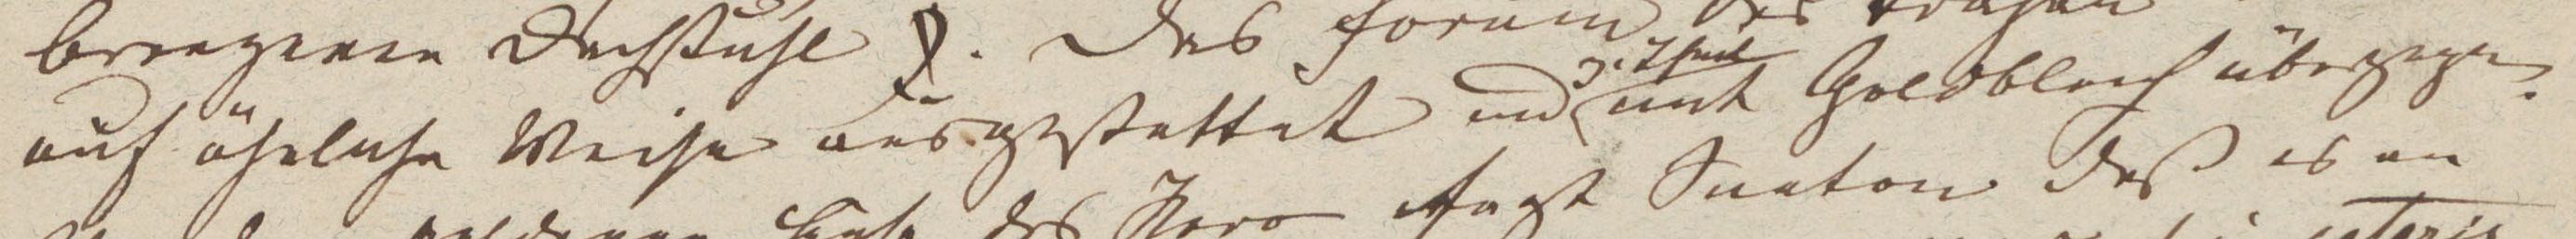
auf ähnliche Weise ausgestattet und z. Theil mit Goldblech überzogen.
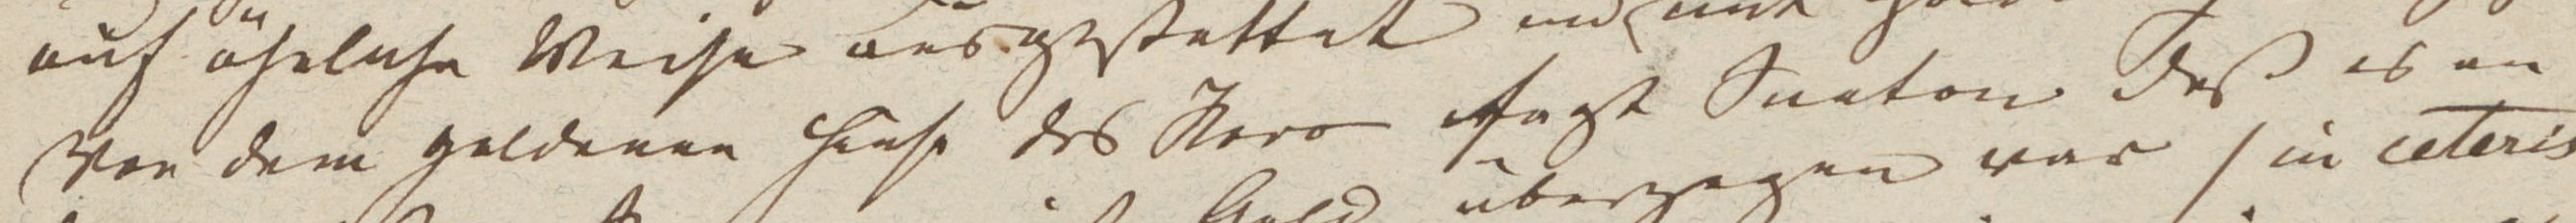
Von dem goldenen Hause des Nero sagt Sueton dass es an
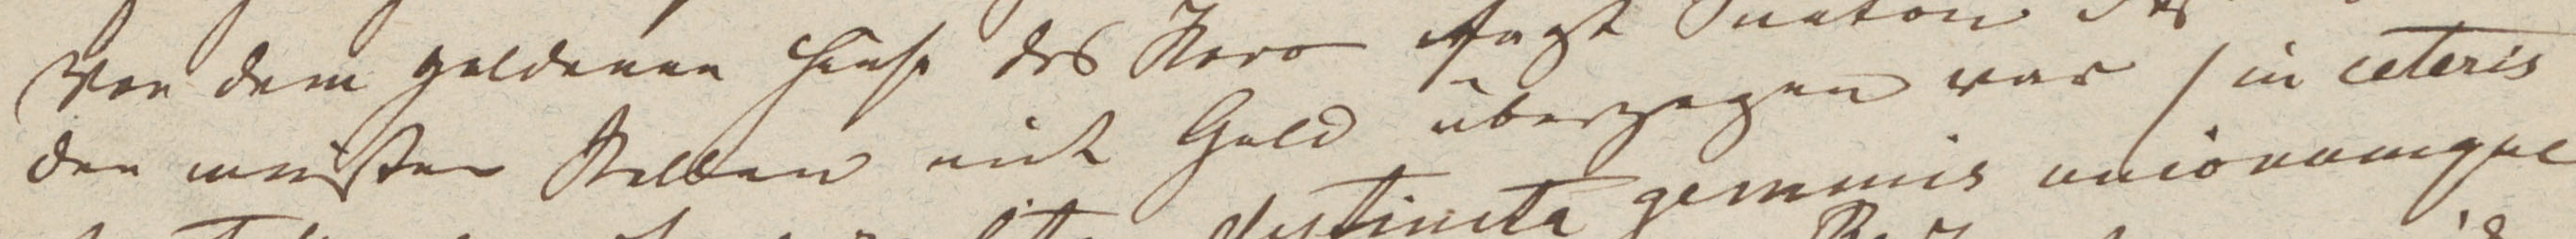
den meisten Stellen mit Gold überzogen war (in ceteris
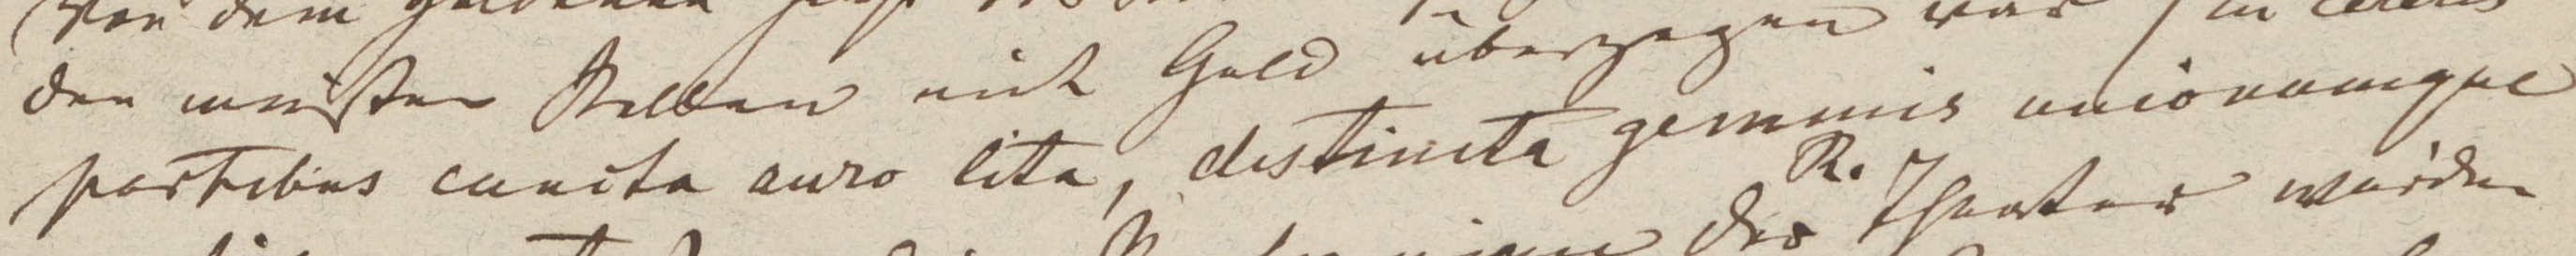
partibus cuncta auro lita, distinicta gemmis unionumque
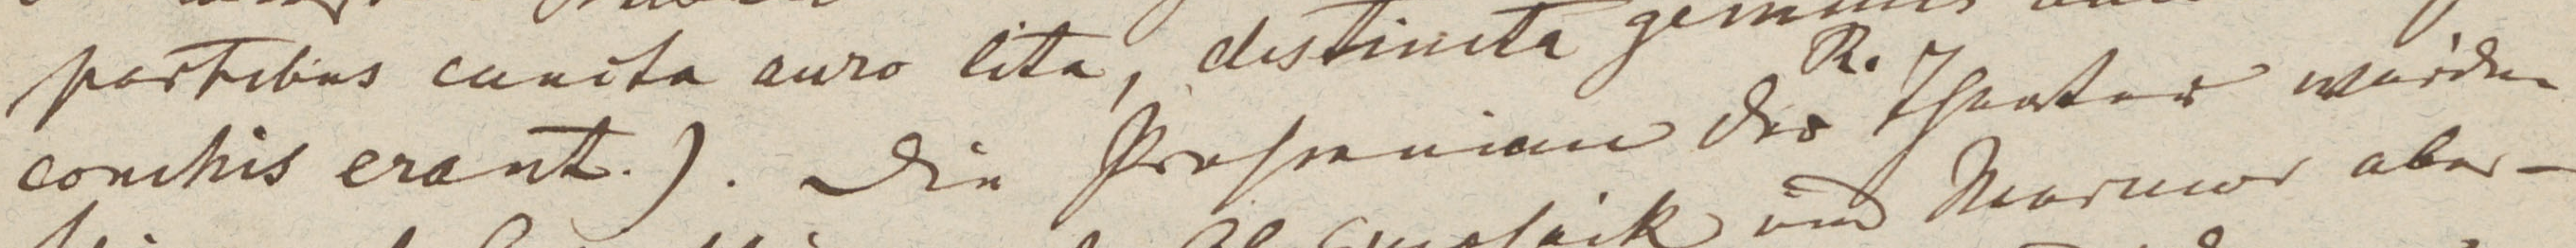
conchis erant.). Die Proscenien der R. Theater wurden
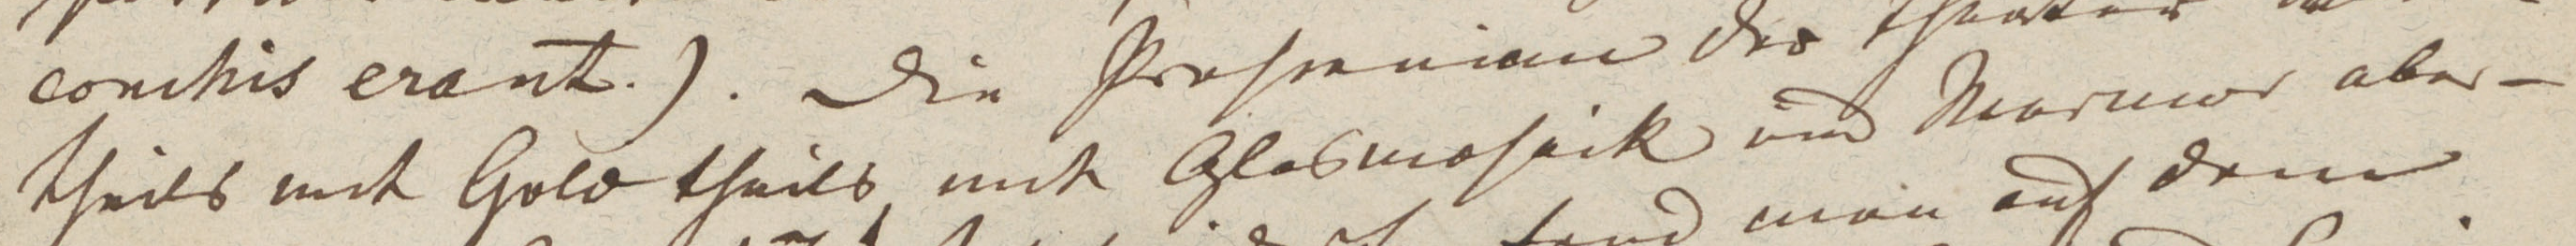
theils mit Gold theils mit Glasmosaik und Marmor uber-
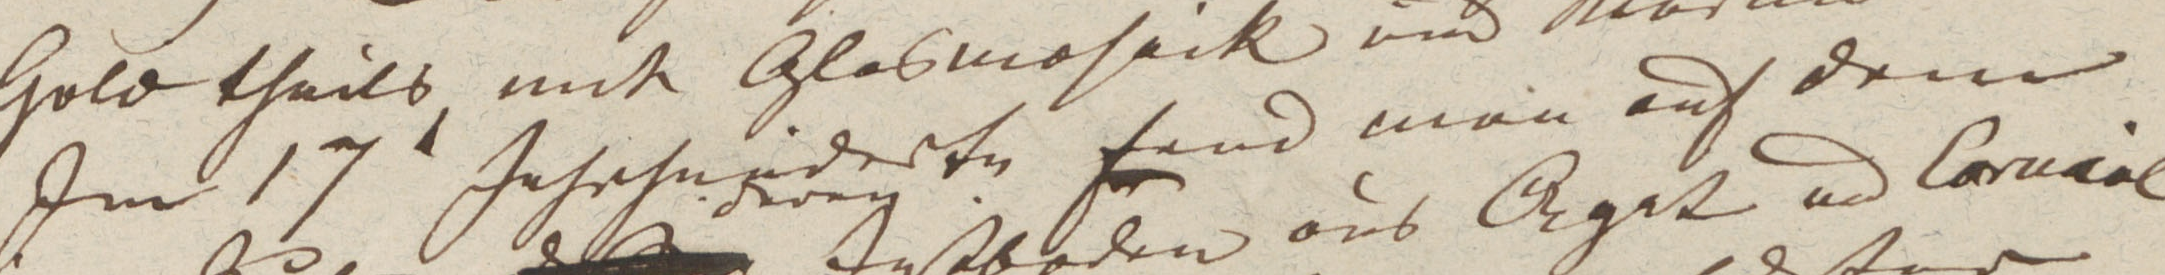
Im 17t Jahrhunderte fand man auf dem
